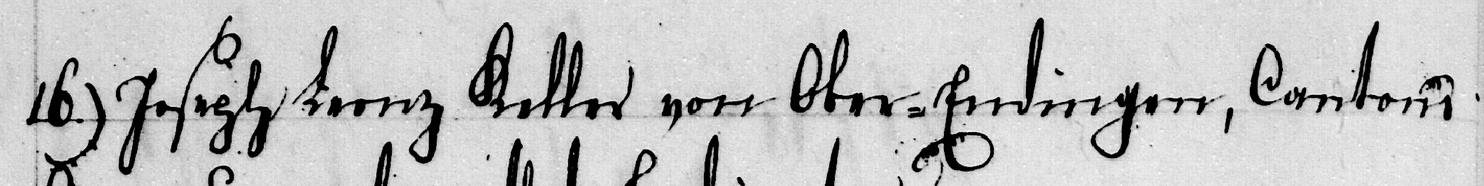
16.) Joseph Lenz Keller von Ober-Endingen, Cantons
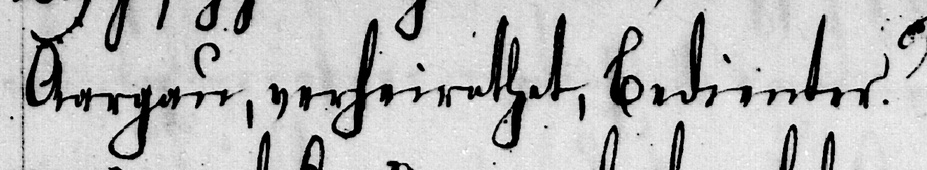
Aargau, verheirathet, Bedienter.
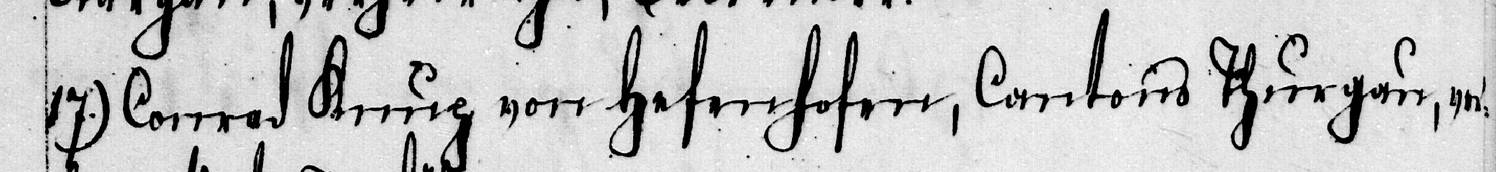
17.) Conrad Knug von Hefenhofen, Cantons Thurgau, v¬
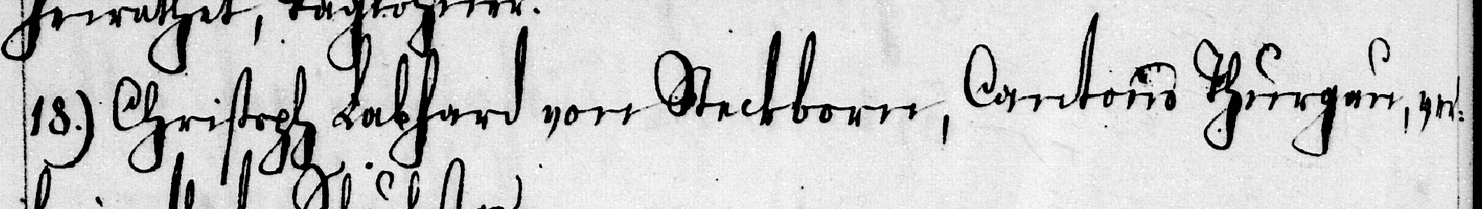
18.) Christoph Labhard von Steckborn, Cantons Thurgau, ve¬
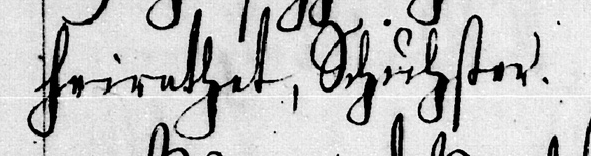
rheirathet, Schuhster.
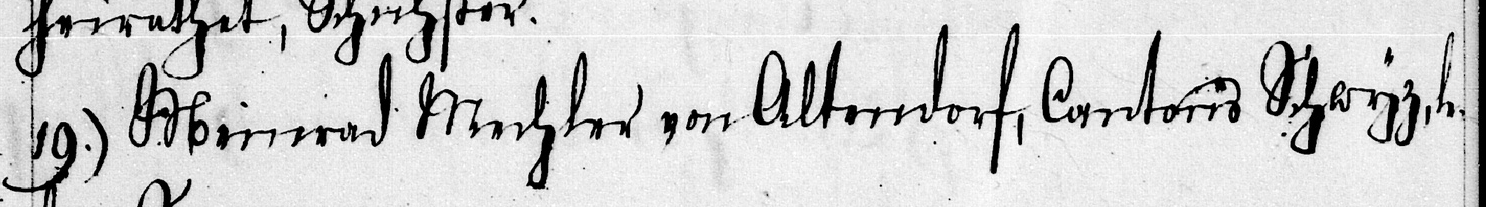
19.) Meinrad Mechler von Altendorf, Cantons Schwyz, l¬
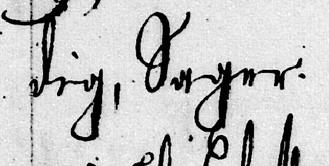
edig, Sager.
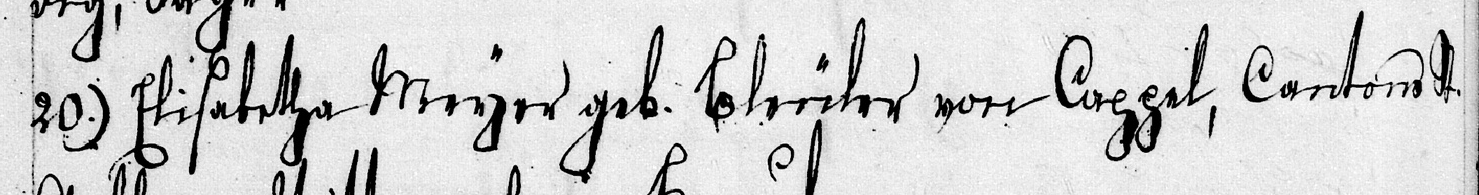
20.) Elisabetha Meyer geb. Bleuler von Cappel, Cantons
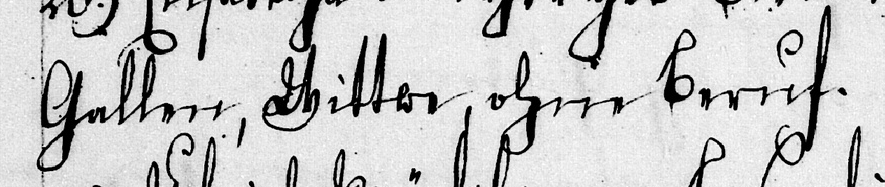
Gallen, Wittwe ohne Beruf.
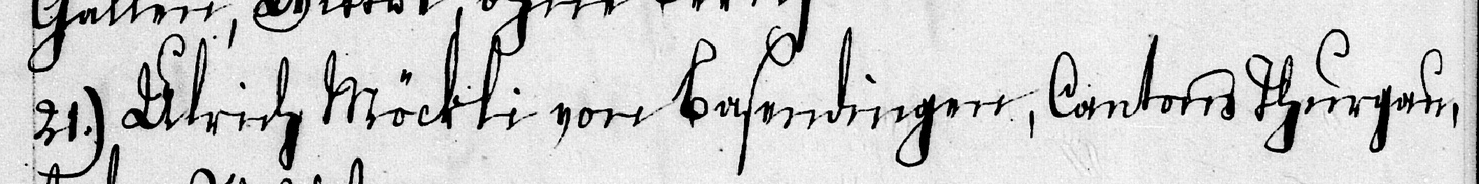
21.) Ulrich Möckli von Basendingen, Cantons Thurgau,
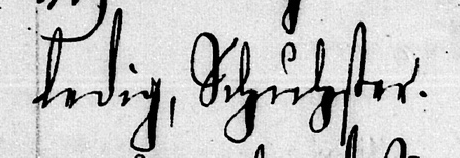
ledig, Schuhster.
